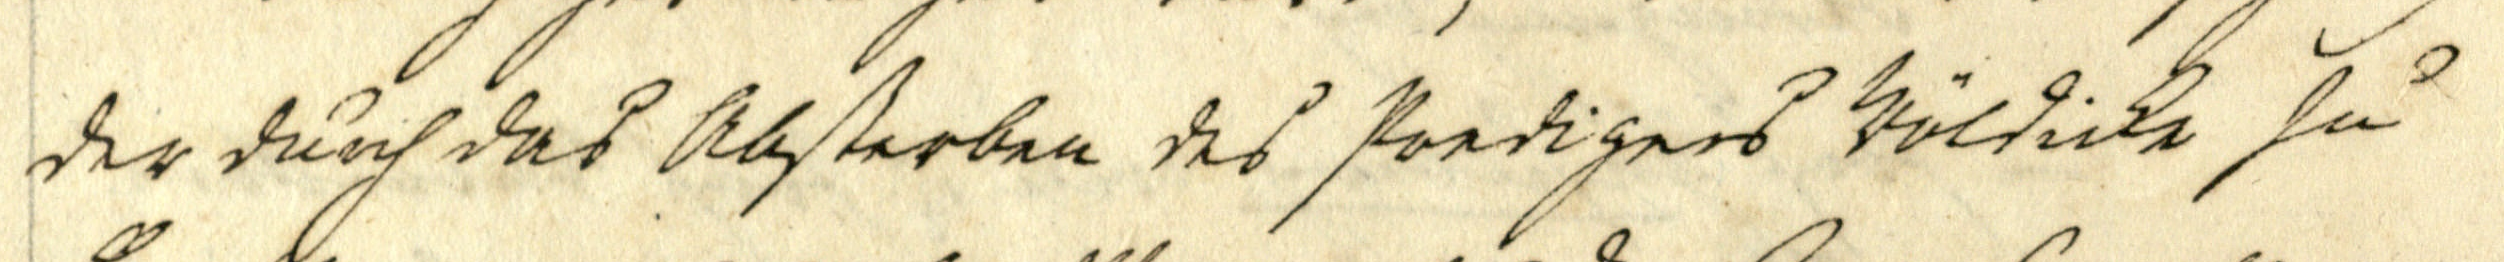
der durch das Absterben des Predigers Wöldicke zu
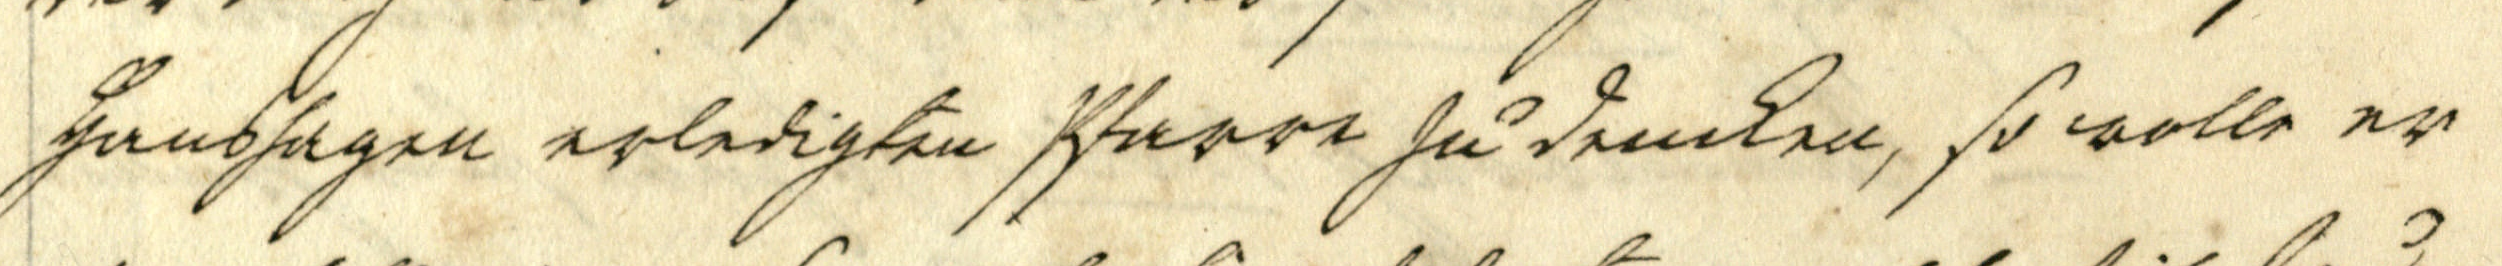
Hanshagen erledigten Pfarre zu dencken, so wolle er
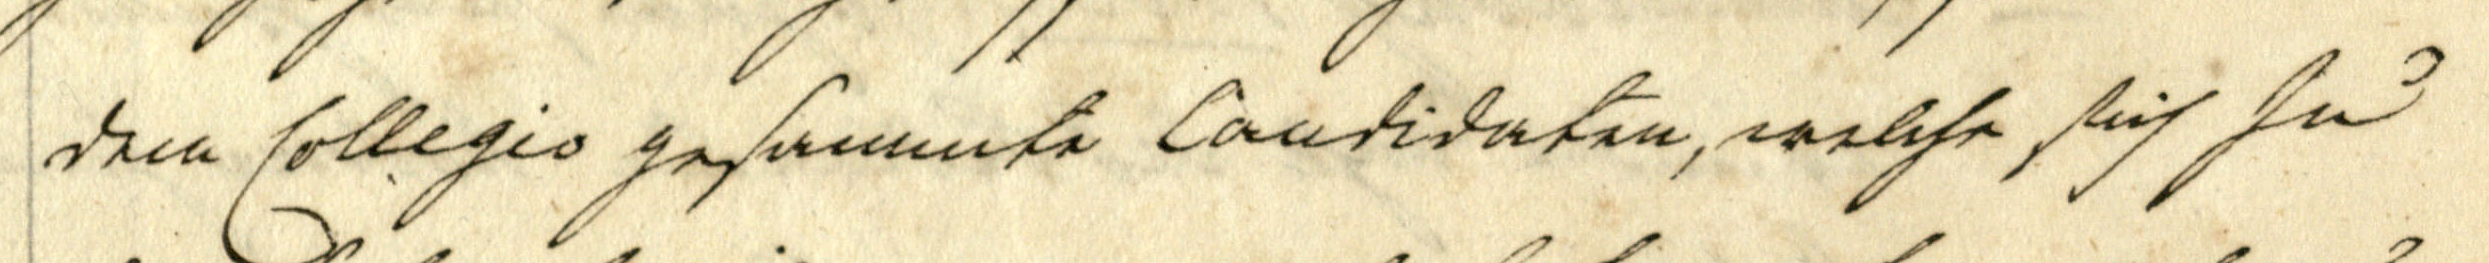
dem Collegio gesammte Candidaten, welche sich zu
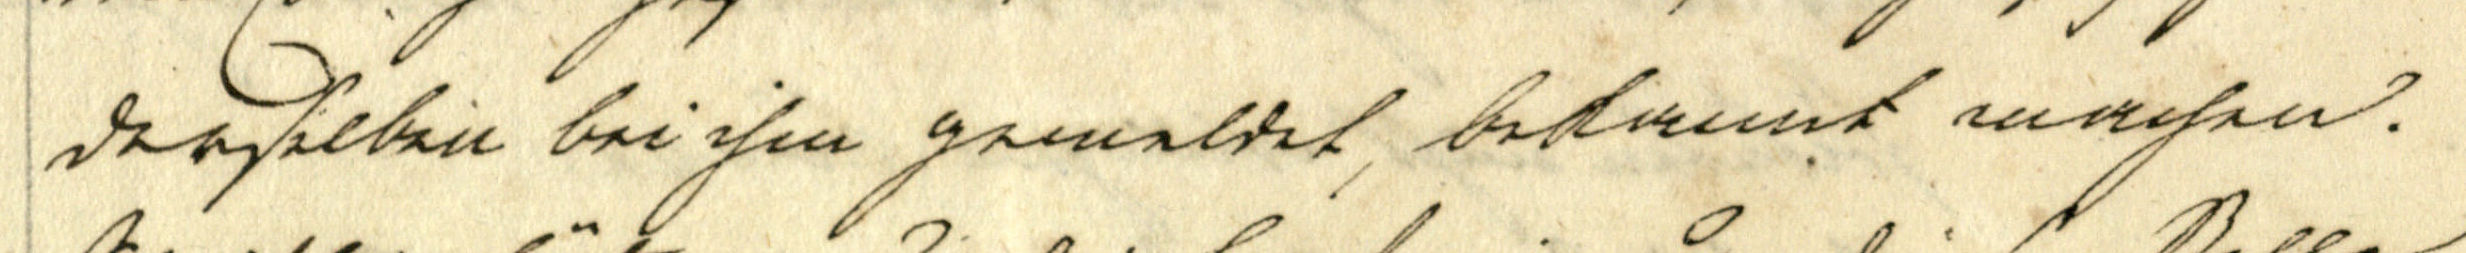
derselben bei ihm gemeldet bekannt machen.
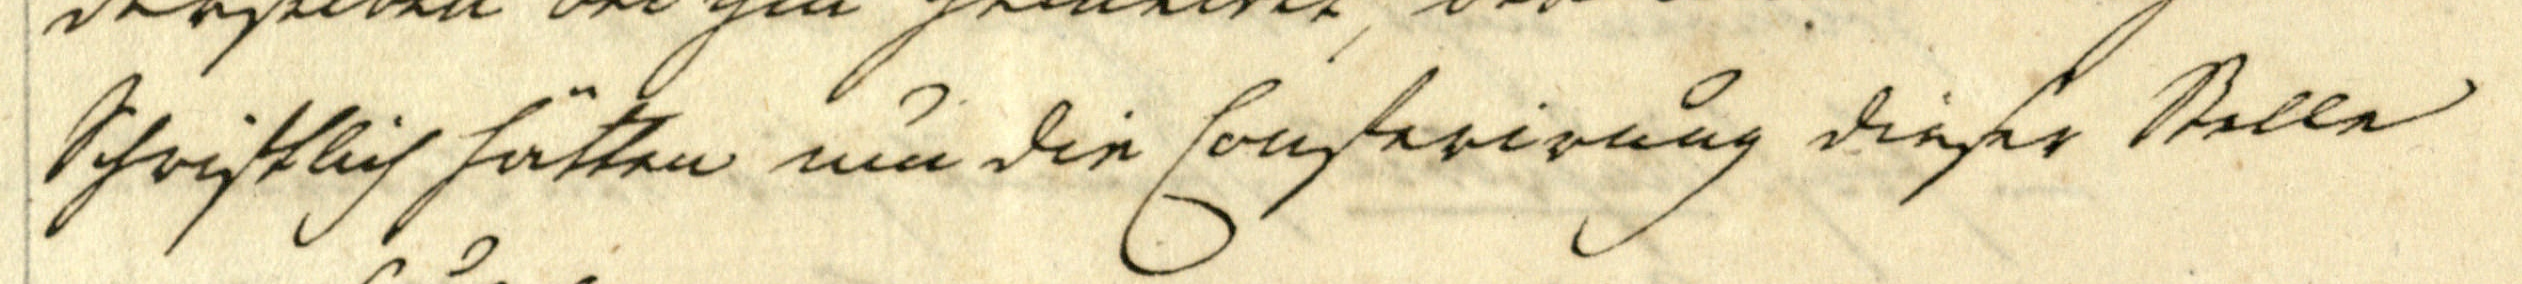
Schriftlich hätten um die Conferirung dieser Stelle
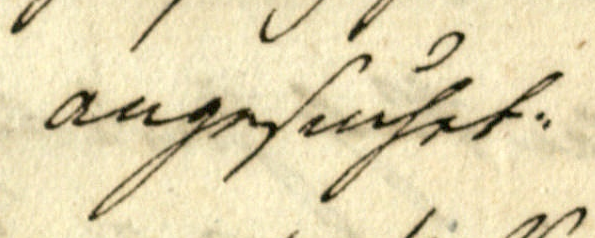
angesuchet:
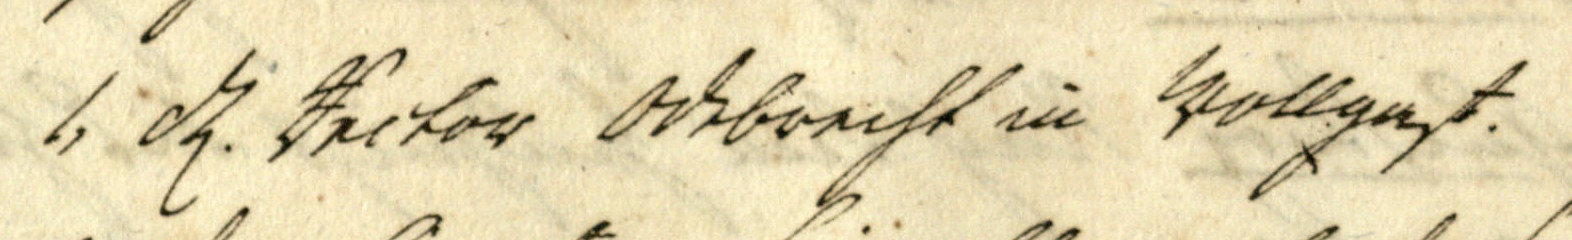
1. dh. Rector Odebrecht in Wolgast.
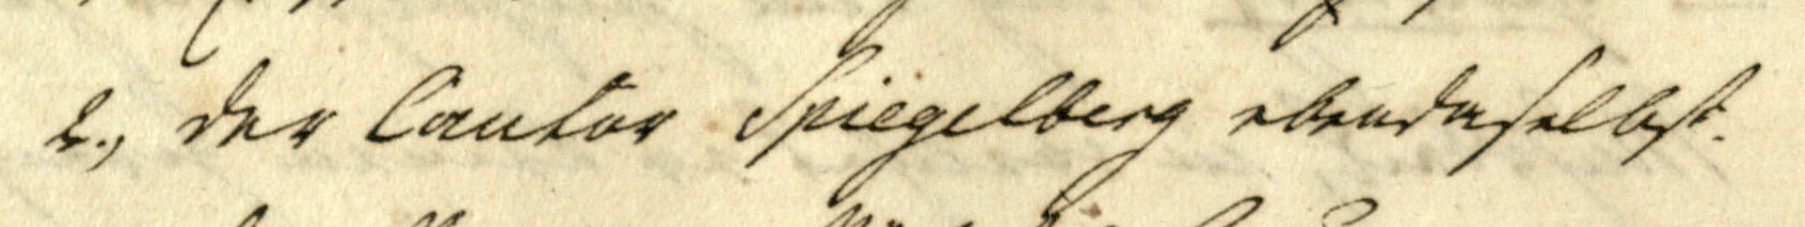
2, der Cantor Spiegelberg ebendaselbst.
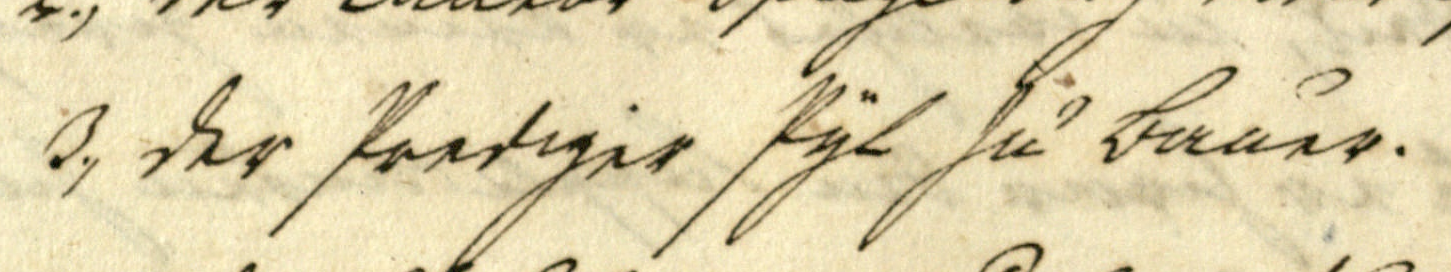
3., der Prediger Pÿl zu Bauer¬
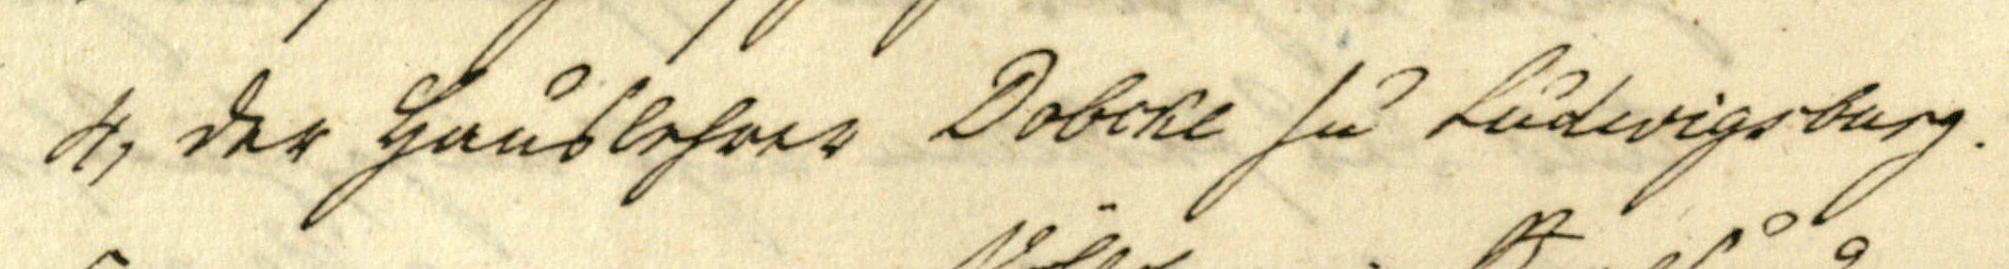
2., der Hauslehrer Dobcke zu Ludwigsburg.
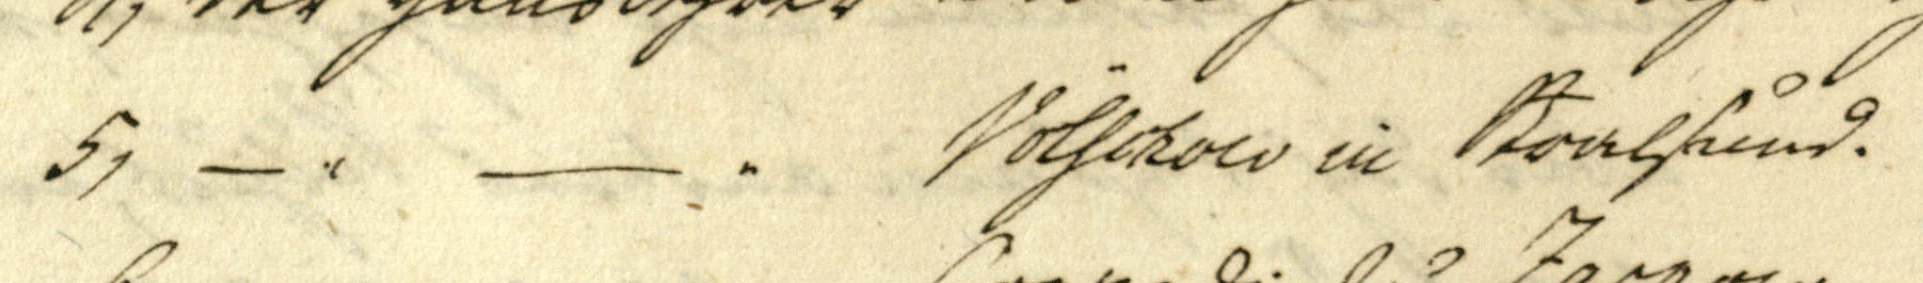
5 " - -Völschow in Stralsund.
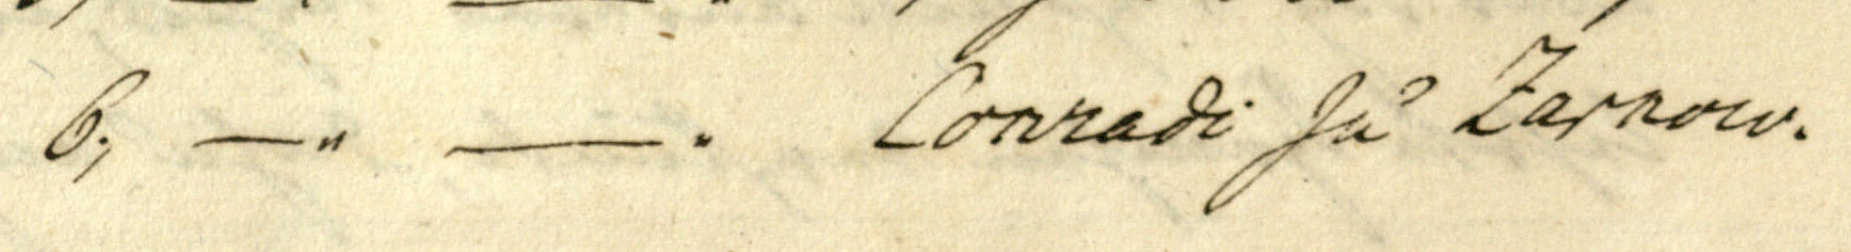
6., - — Conradi zu Zarnow.
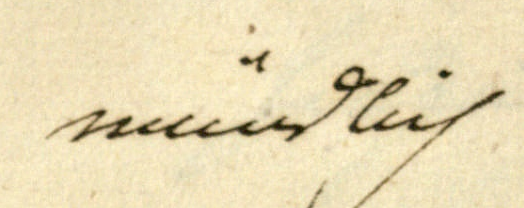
mündlich
